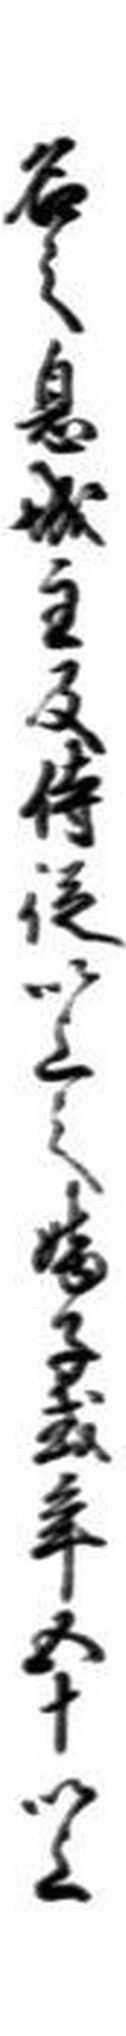名之息城主及侍従以上之嫡子或年五十以上
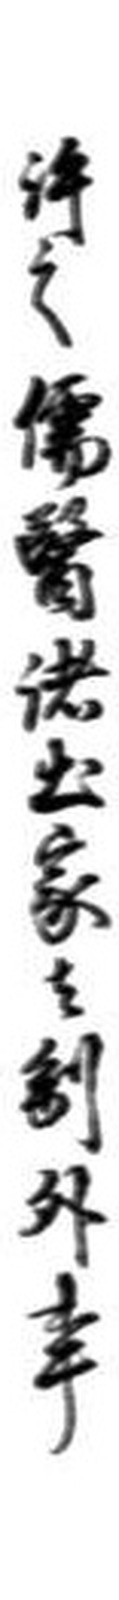許之儒医諸出家者格外事
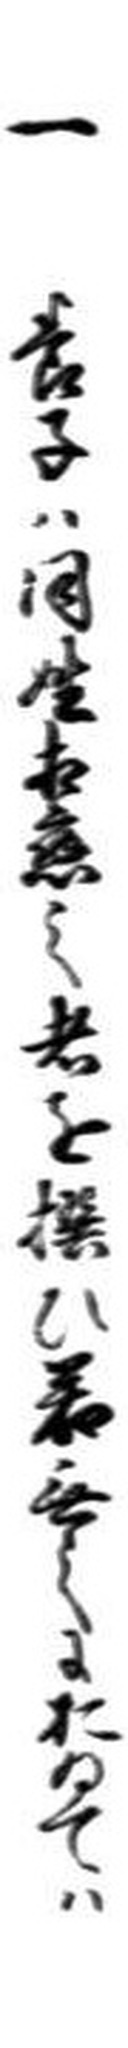一養子ハ同姓相応之者を撰ひ若無之におゐてハ
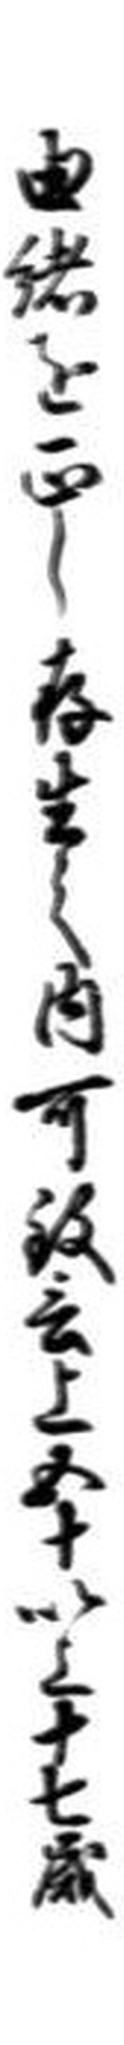由緒を正し存生之内可致言上五十以上十七歳
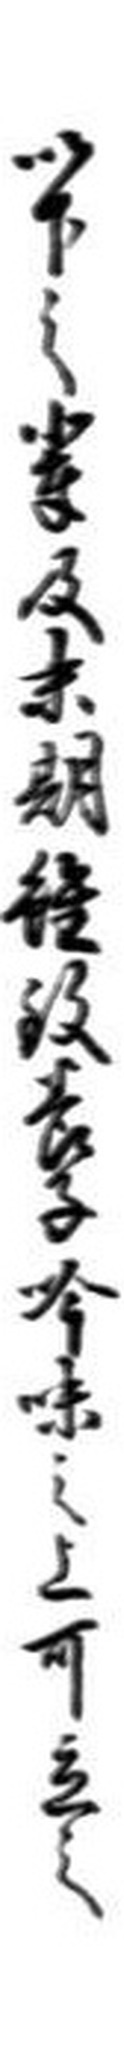以下之輩及末期雖致養子吟味之上可立之

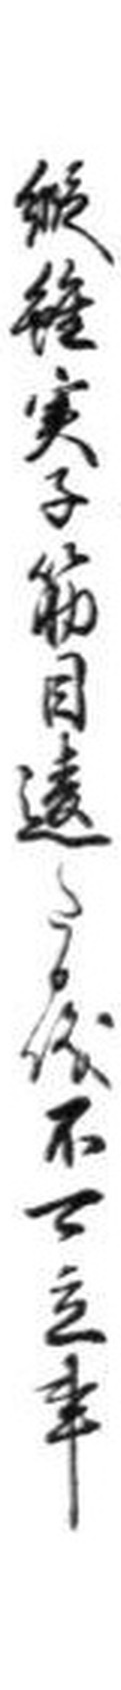縦雖実子筋目違たる儀不可立事
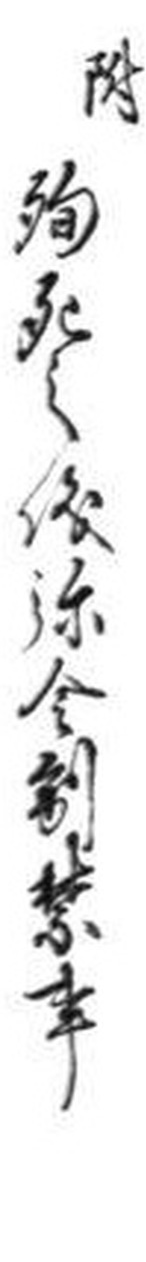殉死之儀弥令制禁事
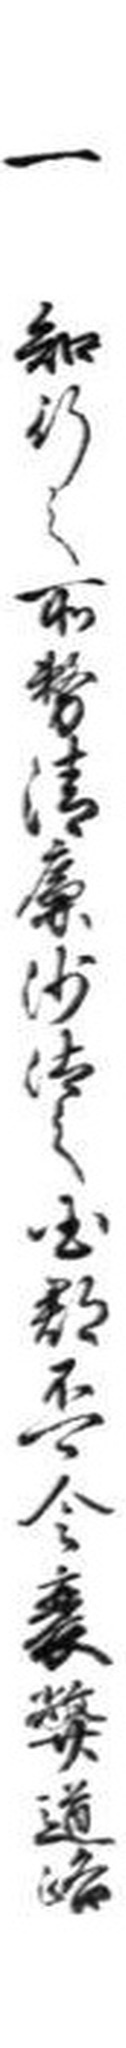一知行之所務清廉沙汰之国郡不可令衰弊道路
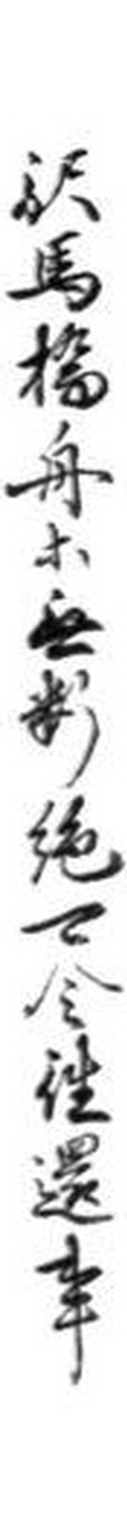駅馬橋舟等無断絶可令往還事
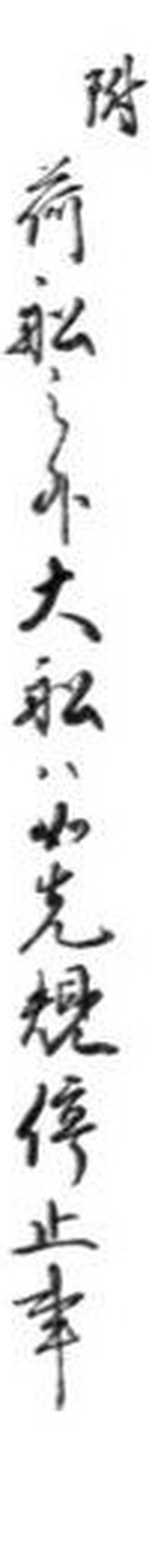荷船之外於御船ハ如先規停止事
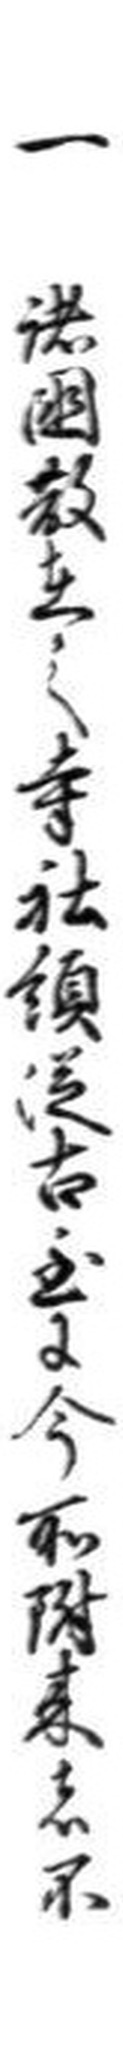一諸国散在之寺社領従古至于今所付来者不
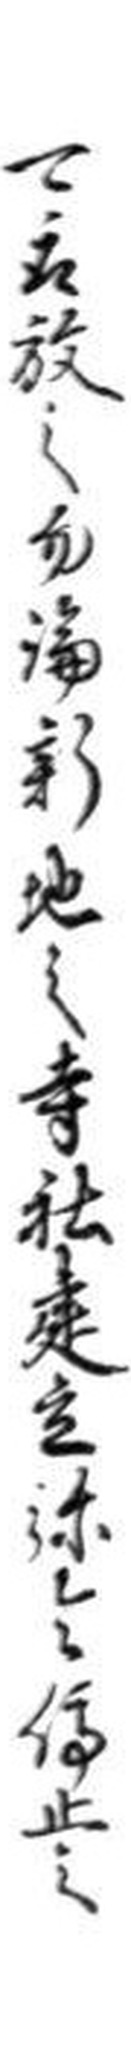可取放之勿論新地之寺社建立弥令停止之
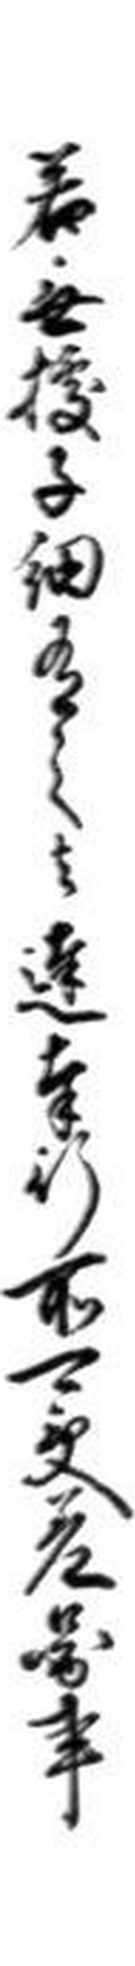若無拠子細有之者達奉行所可受差図事
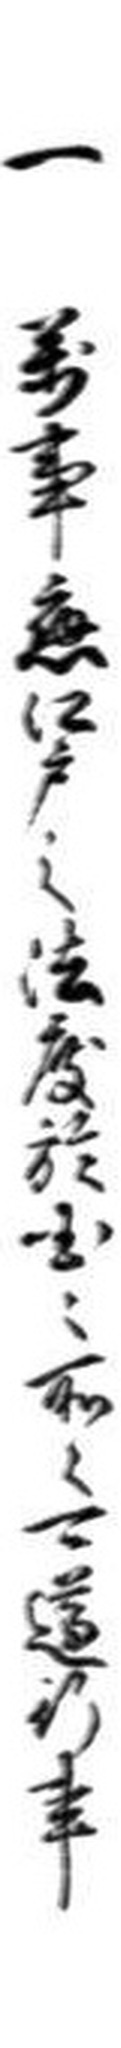一万事応江戸之法度於国々所々可遵行事
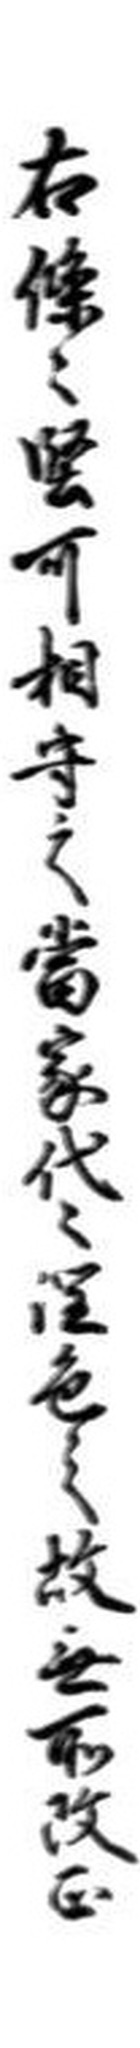右条々堅可相守之当家代々潤色之故無所改正
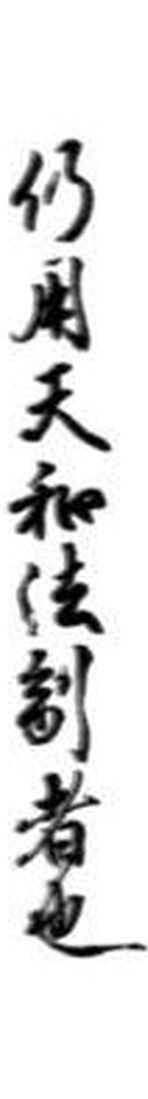仍用天和法制者也
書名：家譜 三十二 吉邦公 従享保二年到享保三年
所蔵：福井県文書館 Fukui Prefectural Archives
